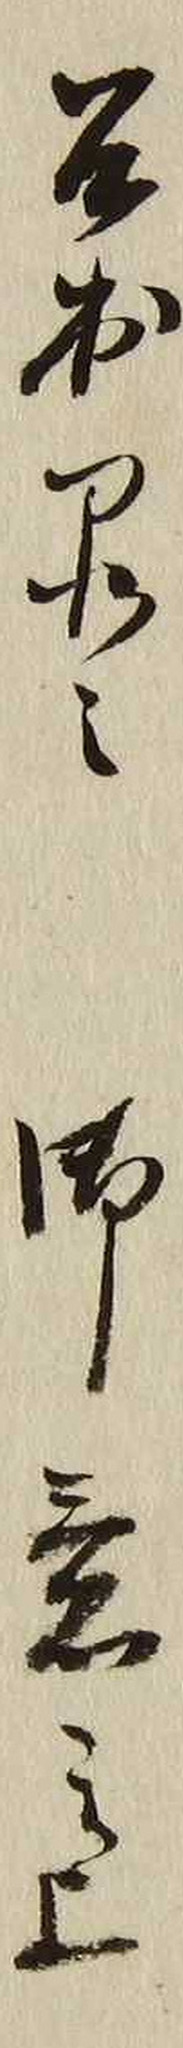召出品々御意之上
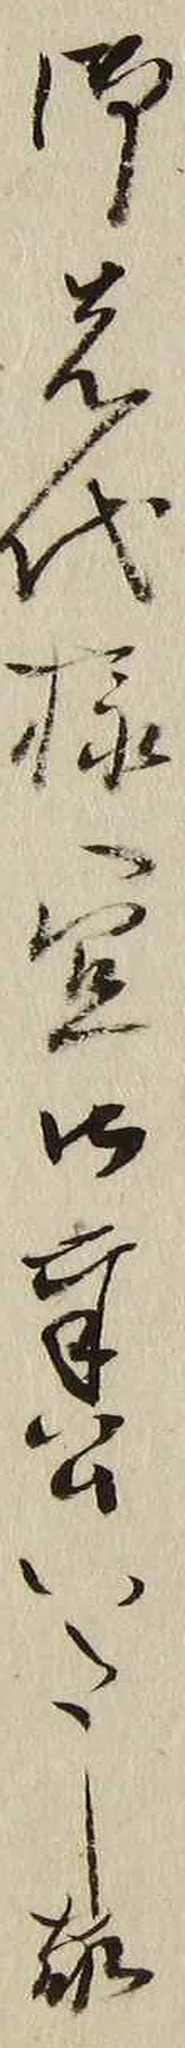御先代様へ宜御奉公いたし候
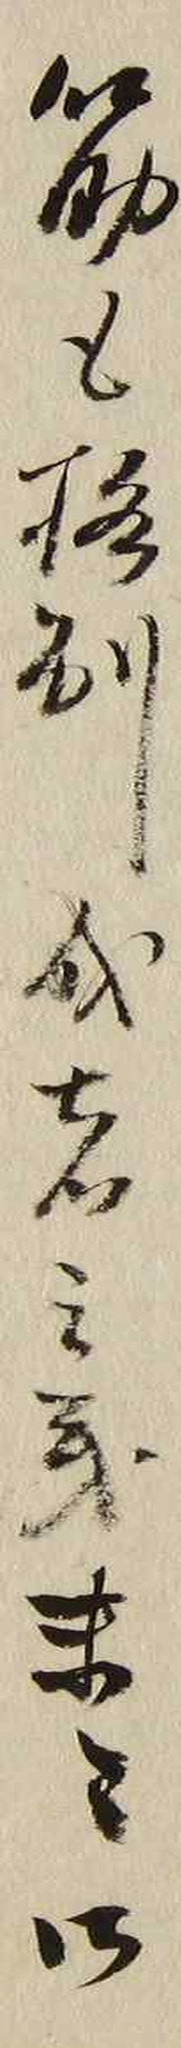筋も格別成者之義末々御
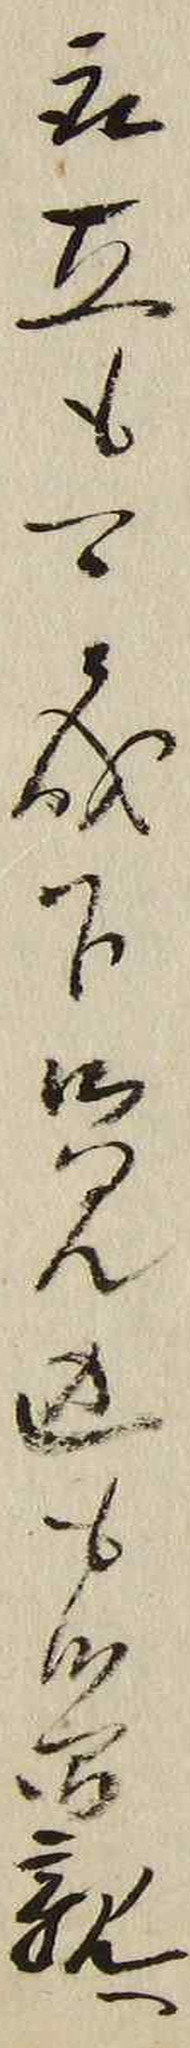取立も可被成下御見込も候間親へ
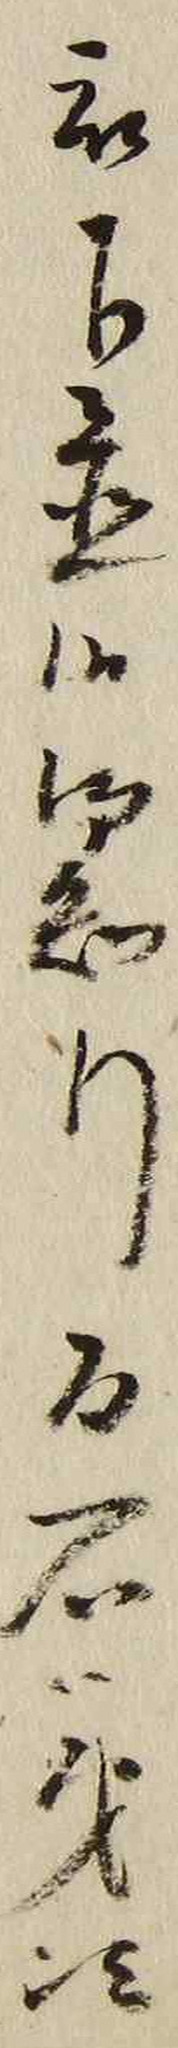被下置候御知行百石ハ弟次

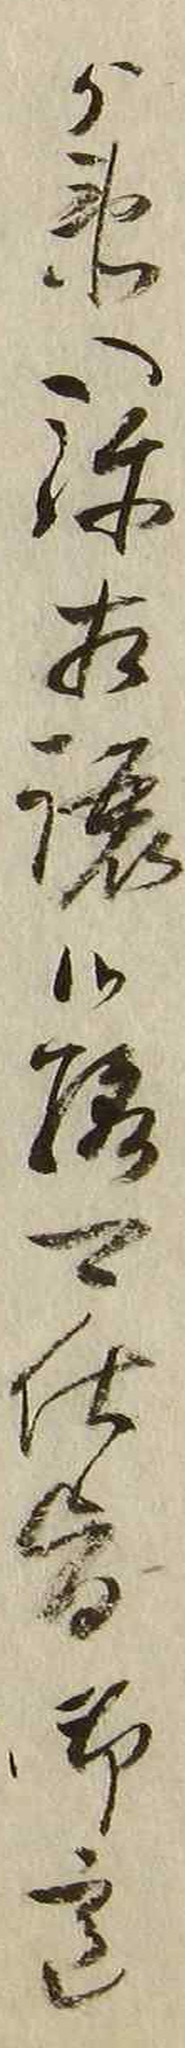兵衛へ弥相譲候様可仕旨御意
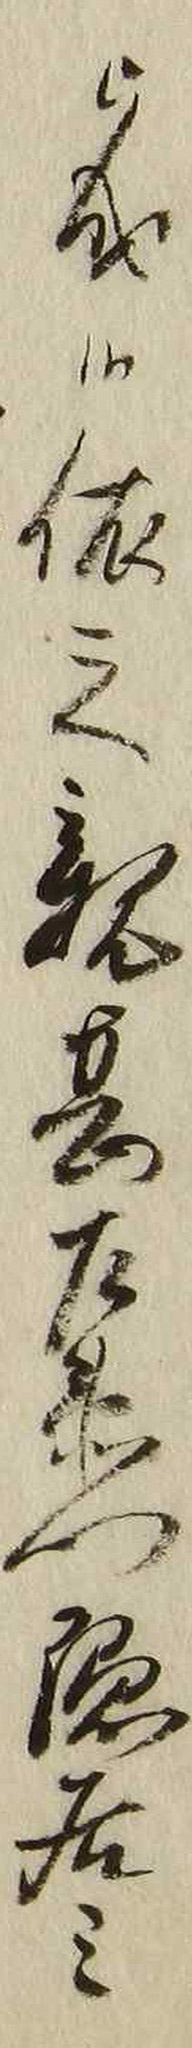被成候依之親甚左衛門隠居之
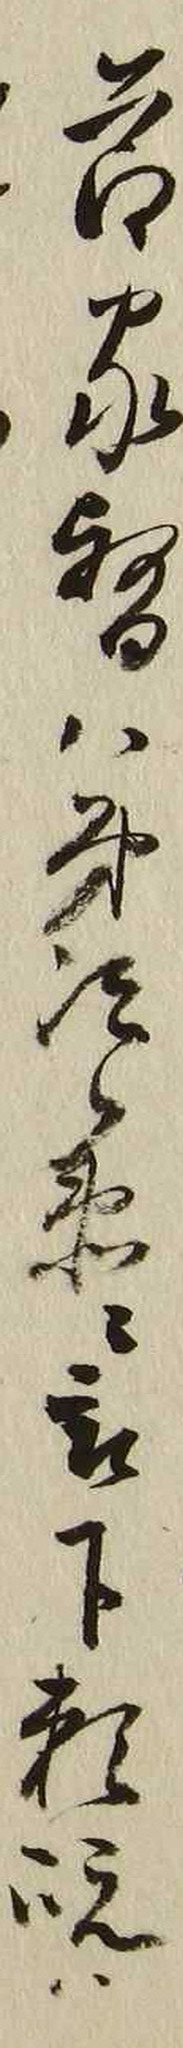節家督ハ弟次兵衛ニ被下頼岏ハ
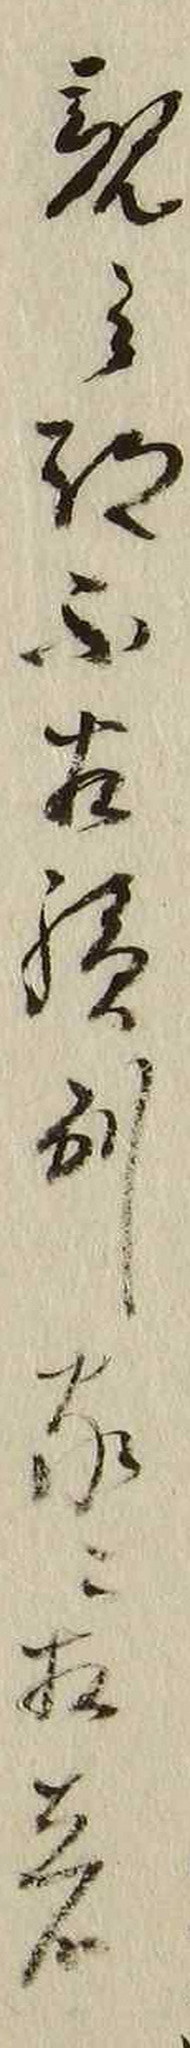親之跡不相続別家ニ相立候
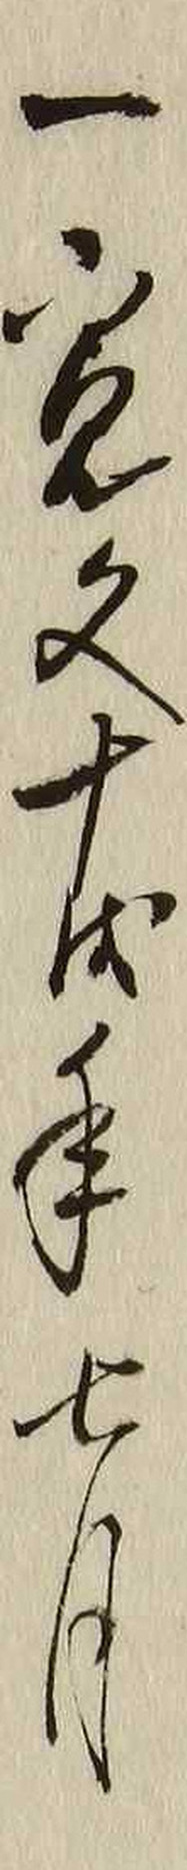一寛文十戌年七月
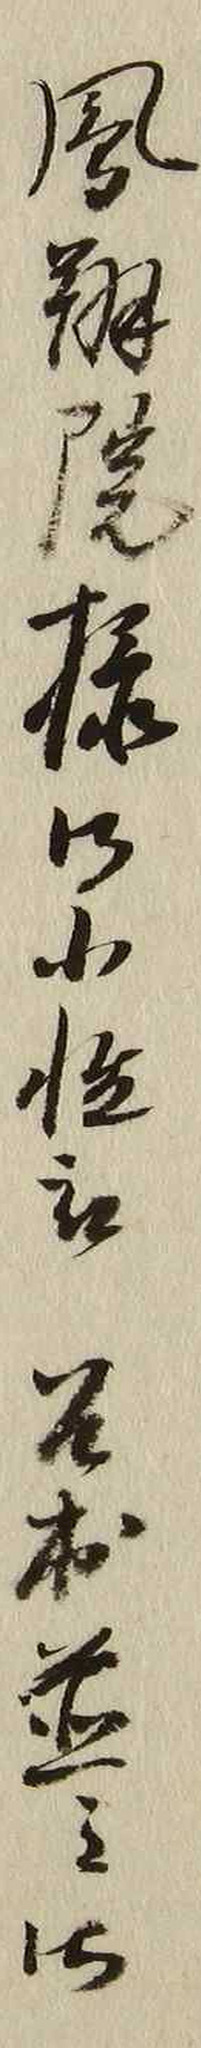鳳翔院様御小性被召出並之御
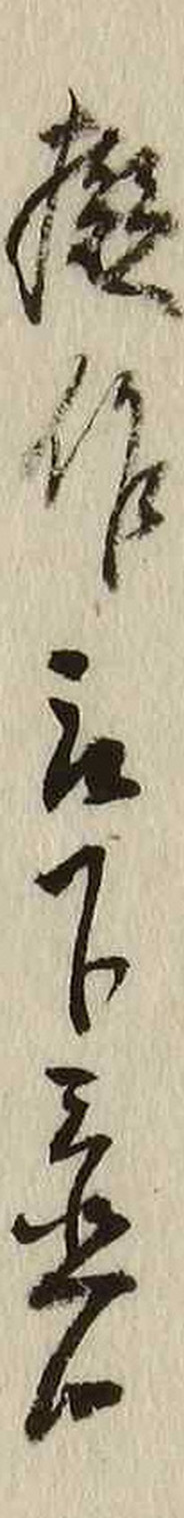擬作被下置候
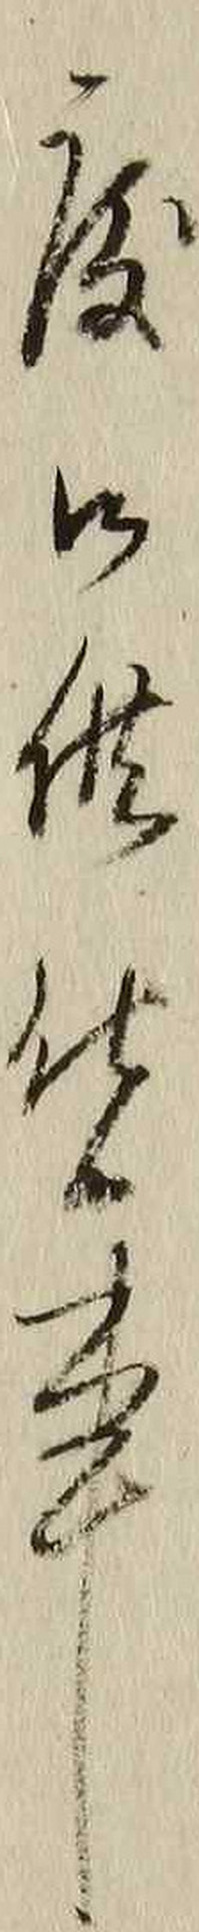度御供仕候事
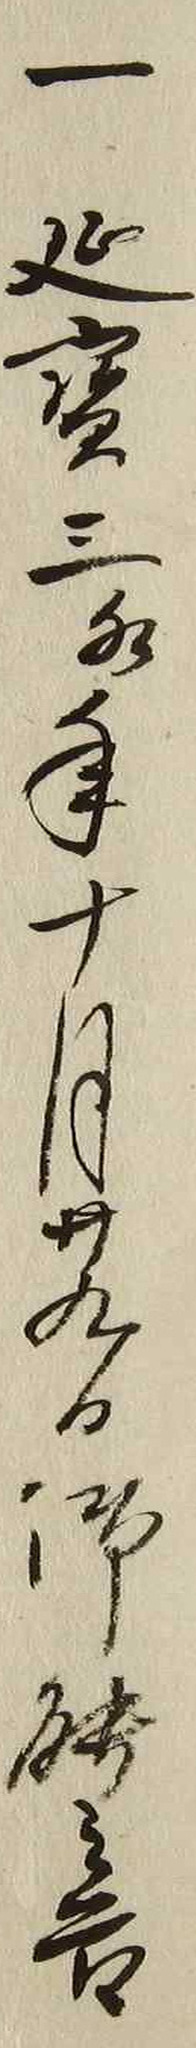一延宝三卯年十月廿九日御能之節
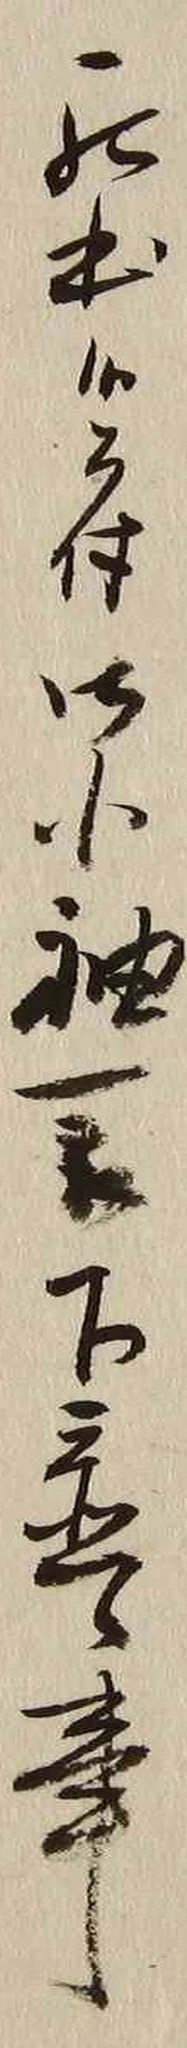罷出候ニ付御小袖一被下置候事
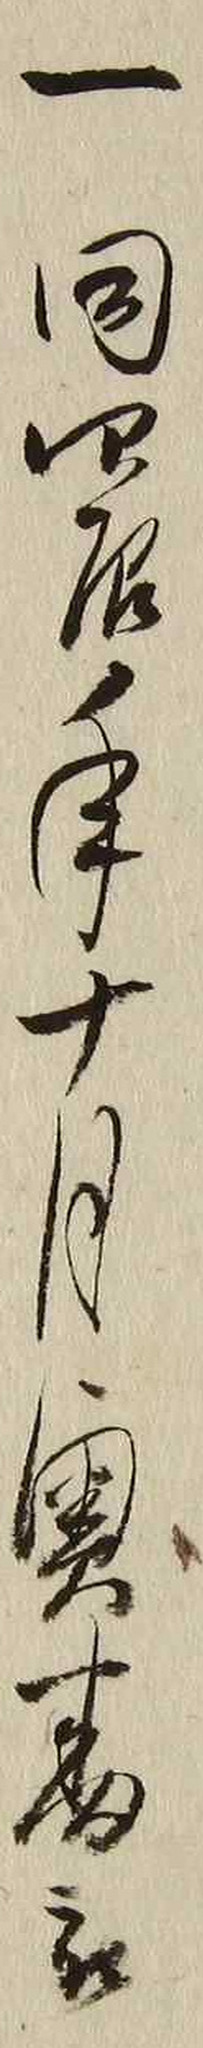一同四辰年十月奥番被
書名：諸士系譜　巻之351　す之部1
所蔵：会津若松市立会津図書館
